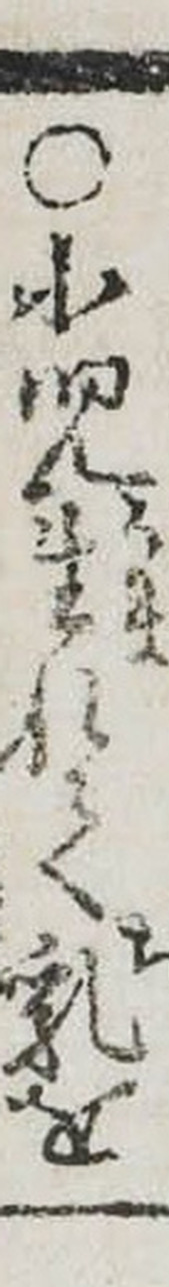○小児生れて乳を
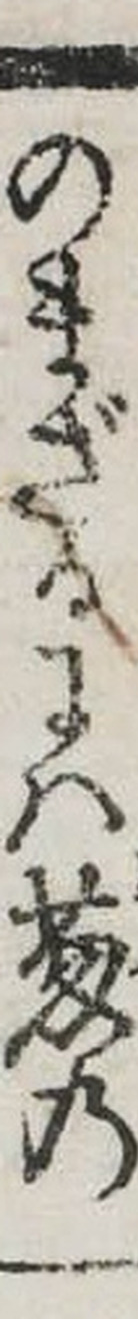のまざるには葱の
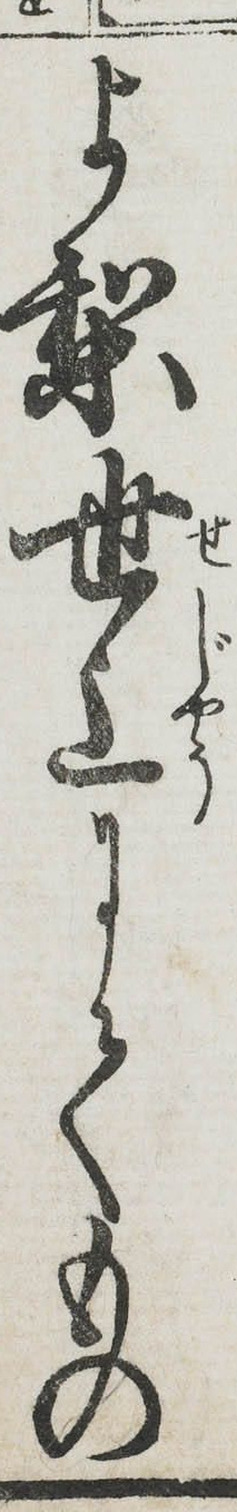より世上にてもの
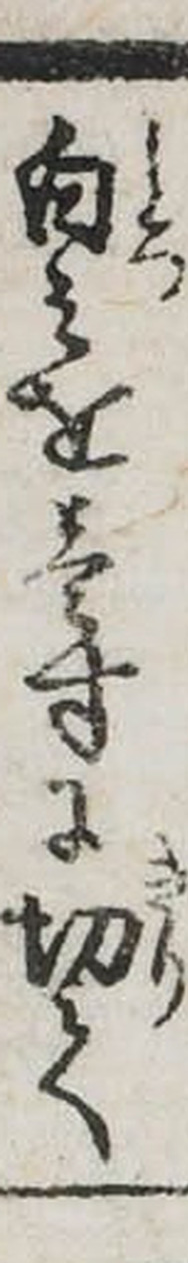白みを壱寸に切て
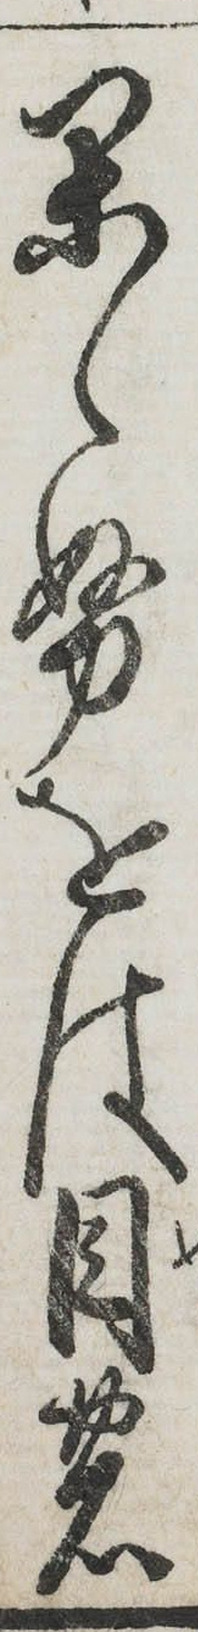かゝぬをは目の
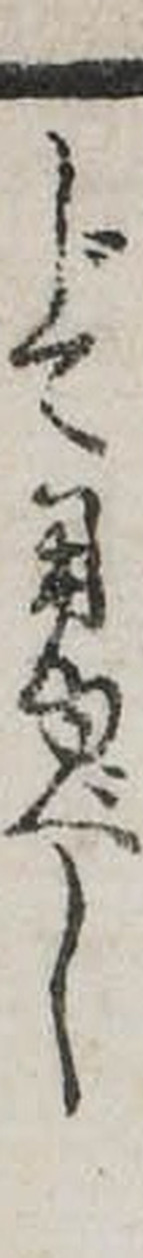じて用ゆべし
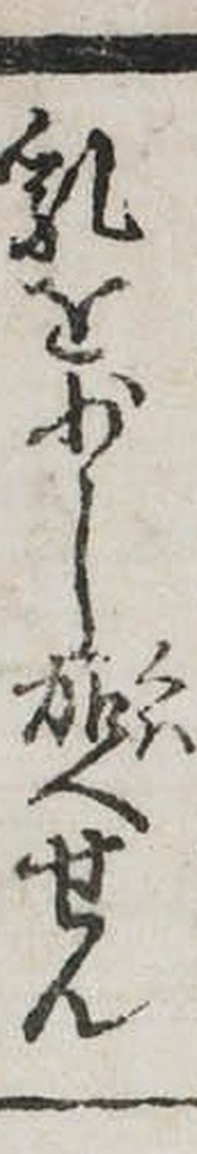乳を少し加へせん
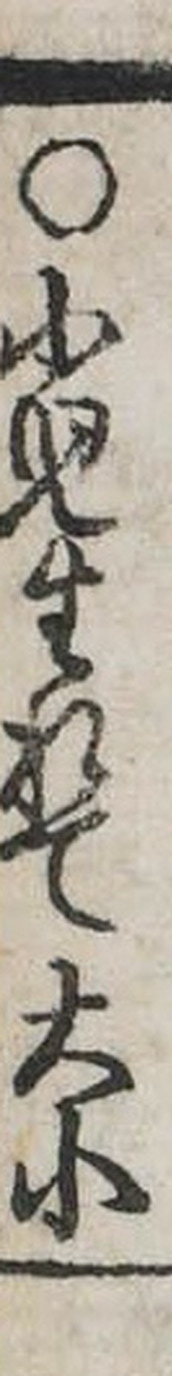○小児生れて大小
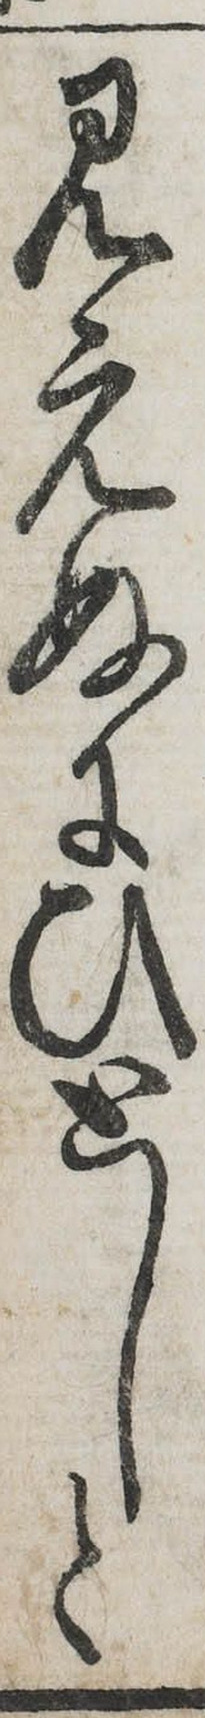見えぬにひとしと

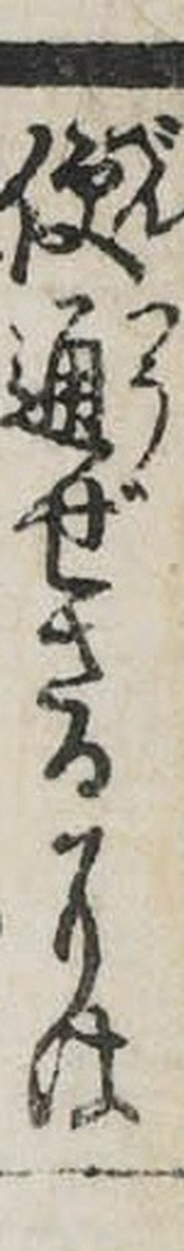便通ぜさるには
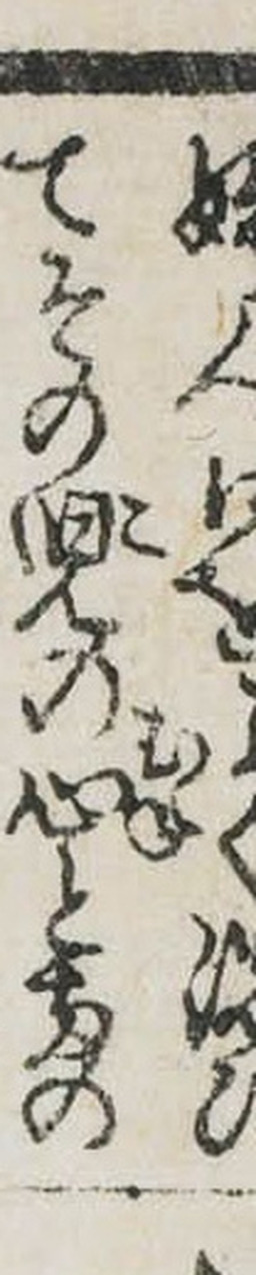てその児の心と両の
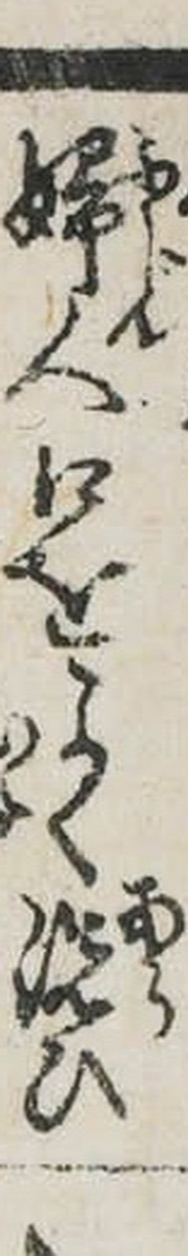婦人口をよく洗ひ
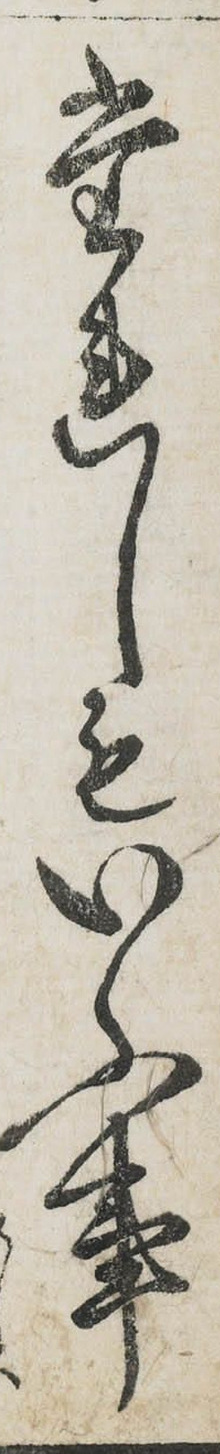たれしもいふ事
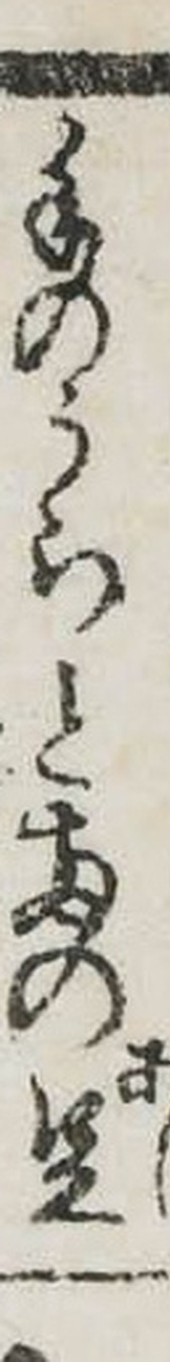手のうらと両の足
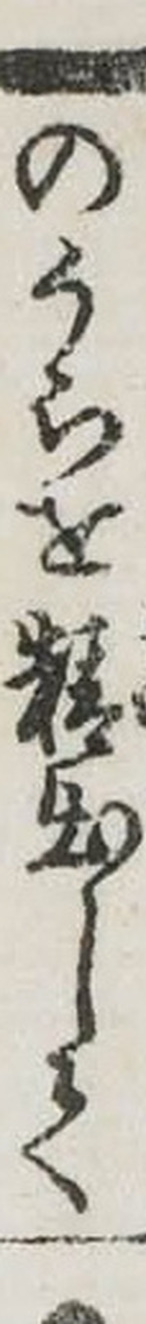のうらを精出して
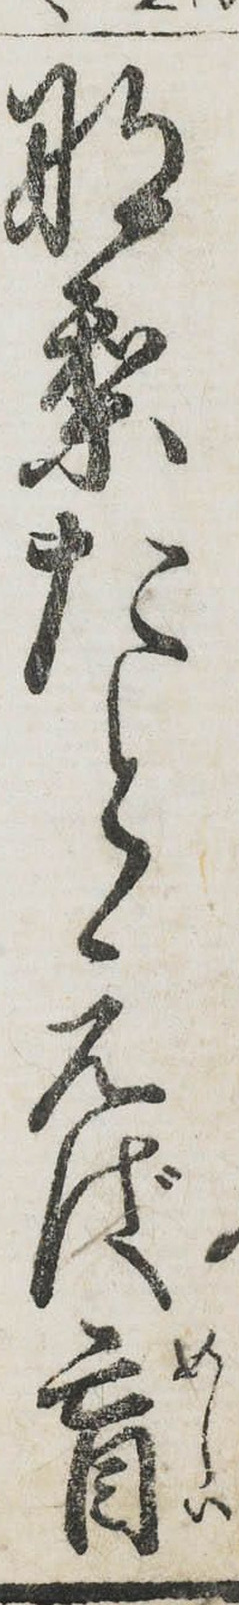なりたとえば盲
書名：頭書萬用婦人手紙之文言
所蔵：東京学芸大学教育コンテンツアーカイブ
